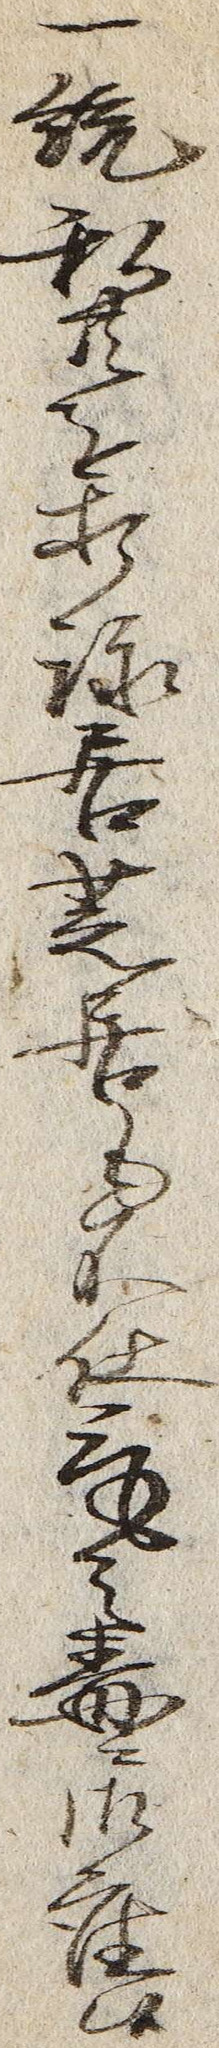一統私どもを内詠居芝居も不仕気の毒に御座候
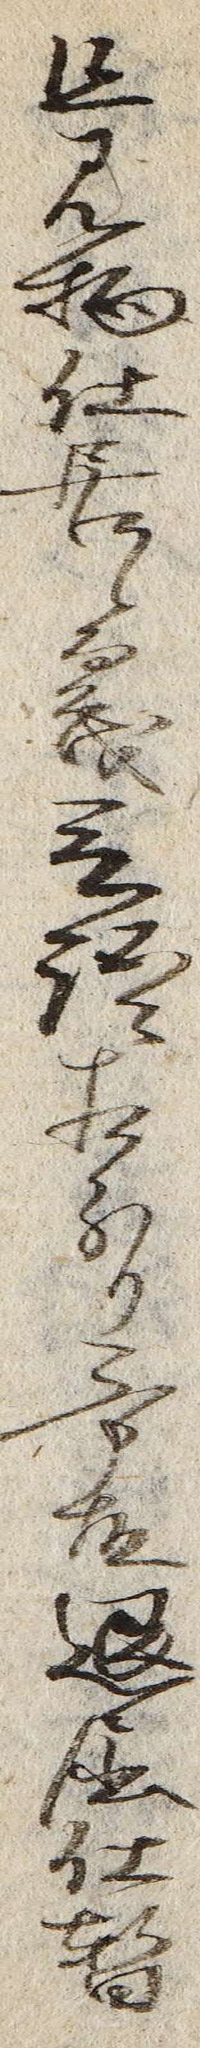且見物仕居候ても言語相分り不申故退屈仕暫
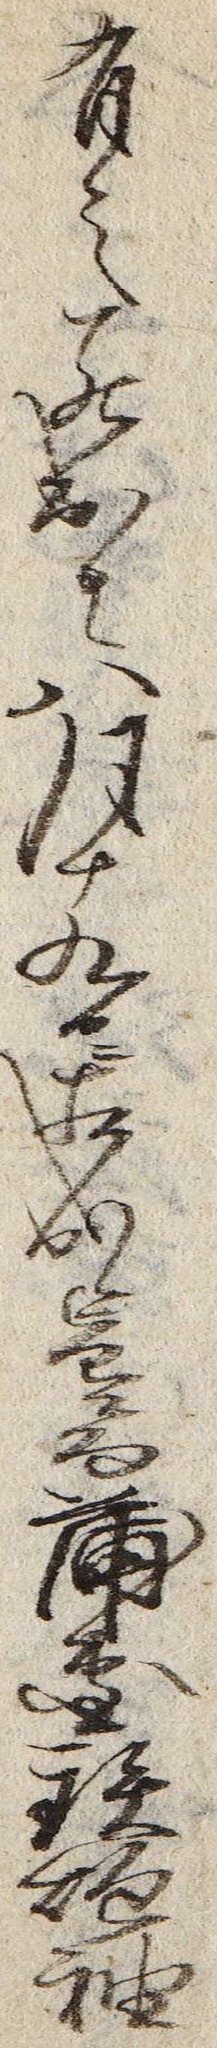有之罷出申候八月十九日に相成候旨にて蒲団鉄砲袖
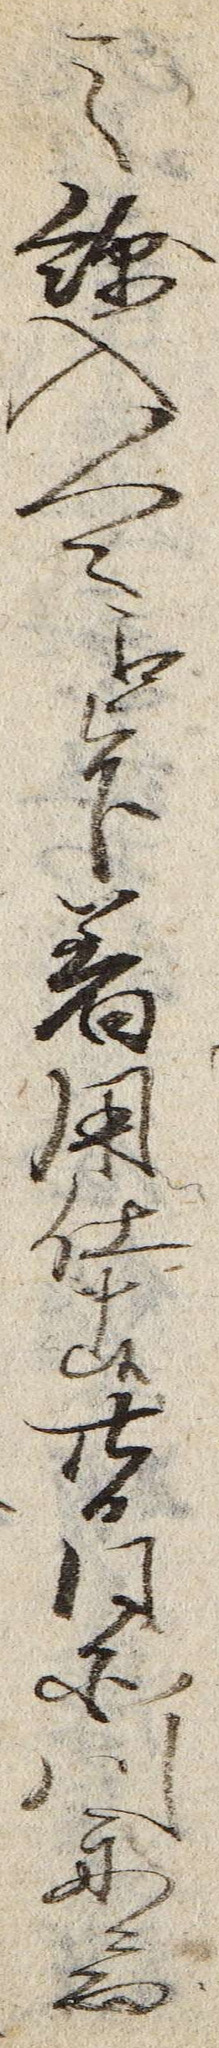の綿入人々へ被下着用仕申候二十日同所川舟にて

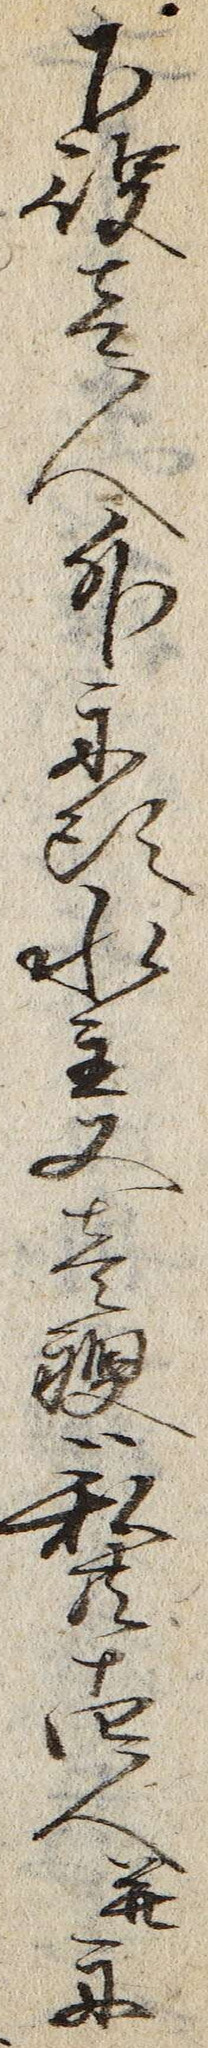下役一人外船頭水主又一艘は私ども十四人幷舟
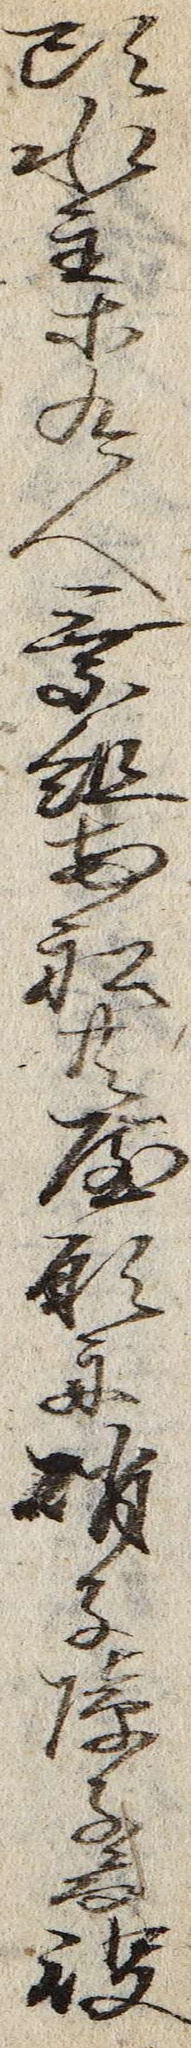頭水主等九人乗組両船とも屋形舟硝子障子にて役
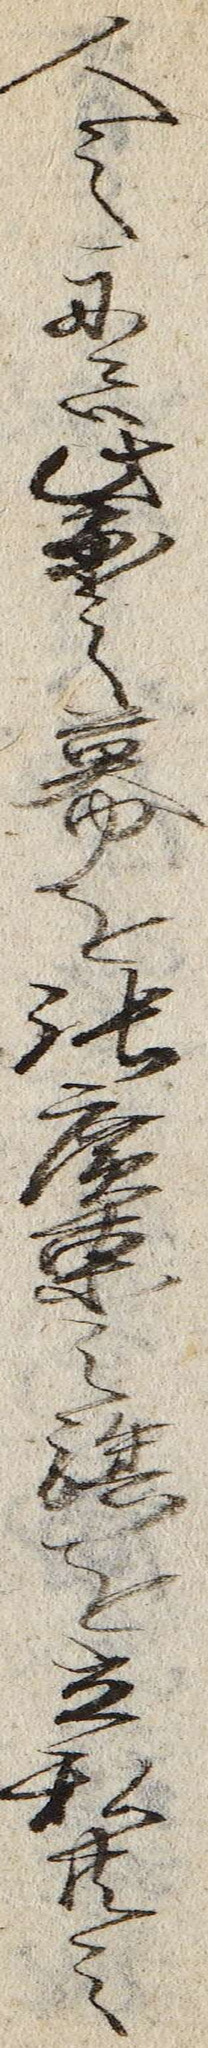人の舟には此国の幕を張広東の旗を立私どもの
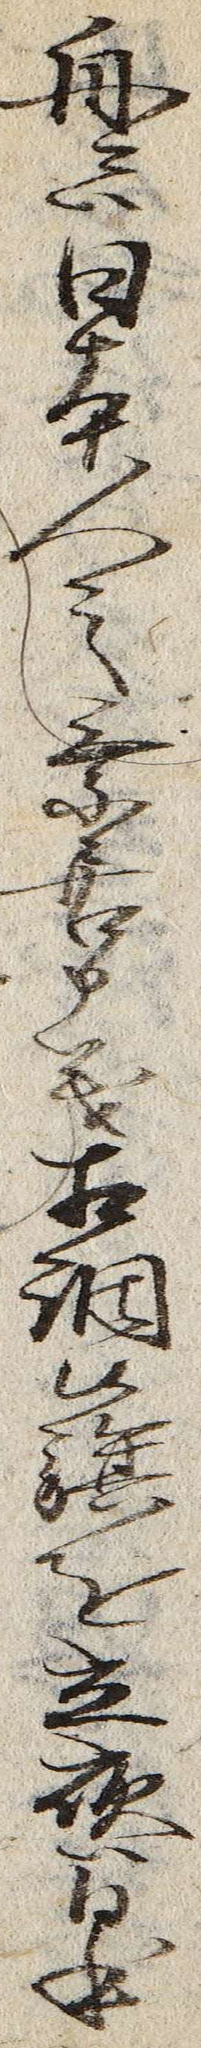舟には日本人の乗居申候義相調候旗を立夜は日本
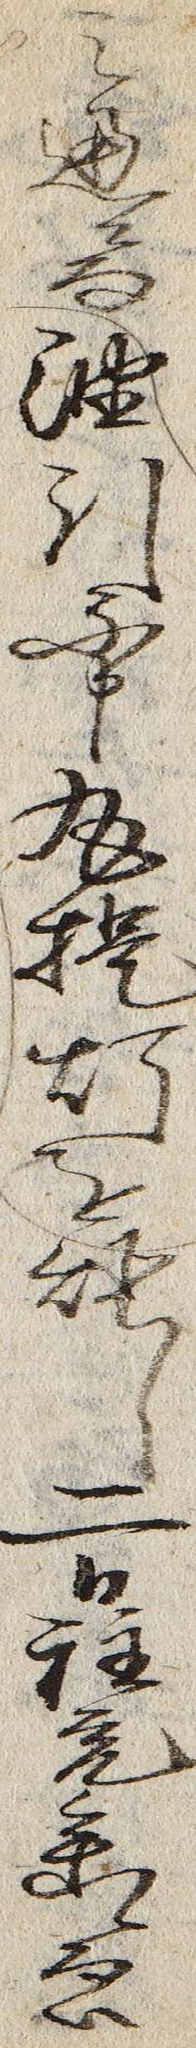の通にて油断不申丸提灯を張候二日程ずつ参候ては
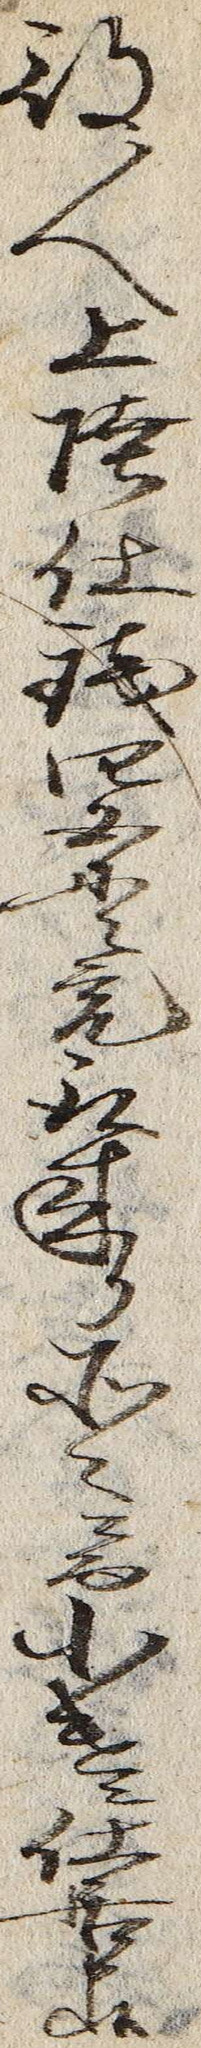役人上陸仕銭四五貫ずつ取来り所々にて小遣に仕申候
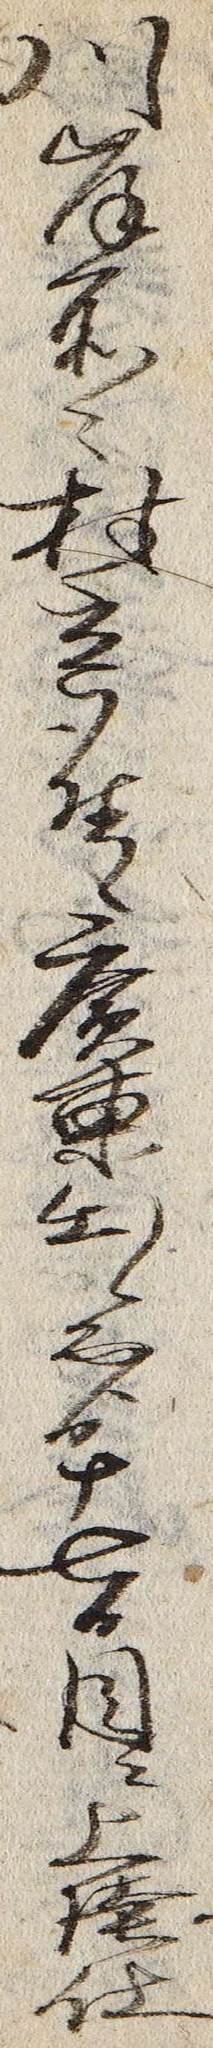川岸所々村立御座候広東出候てより十七日目に上陸仕
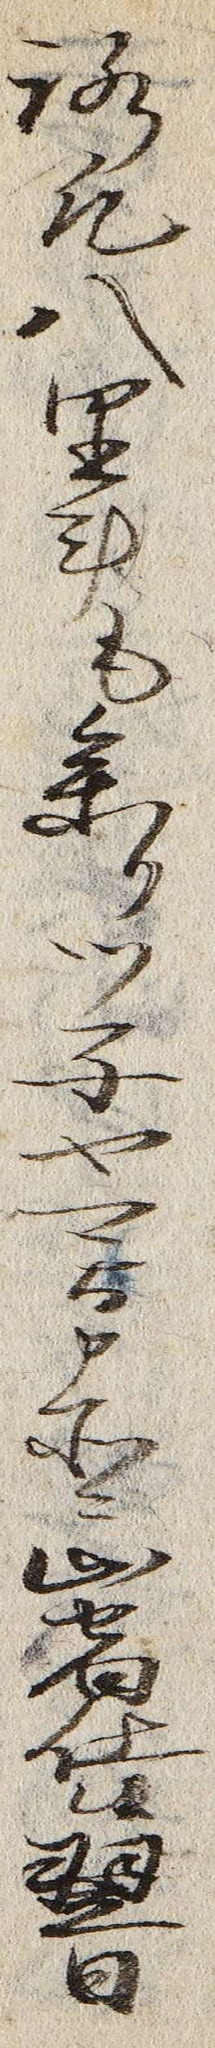路凡八里斗も参りツ子ヤマと申所に止宿候翌日
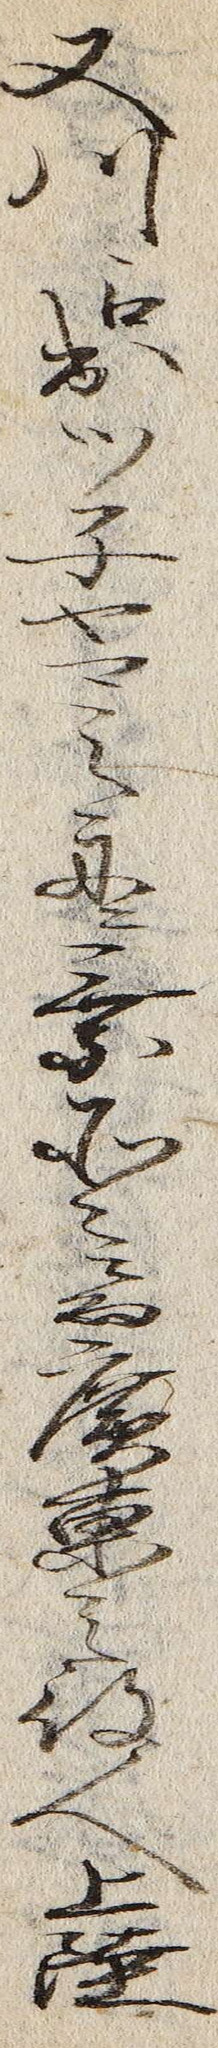又川へ出ツ子ヤマの舟に乗所々にて広東の役人上陸
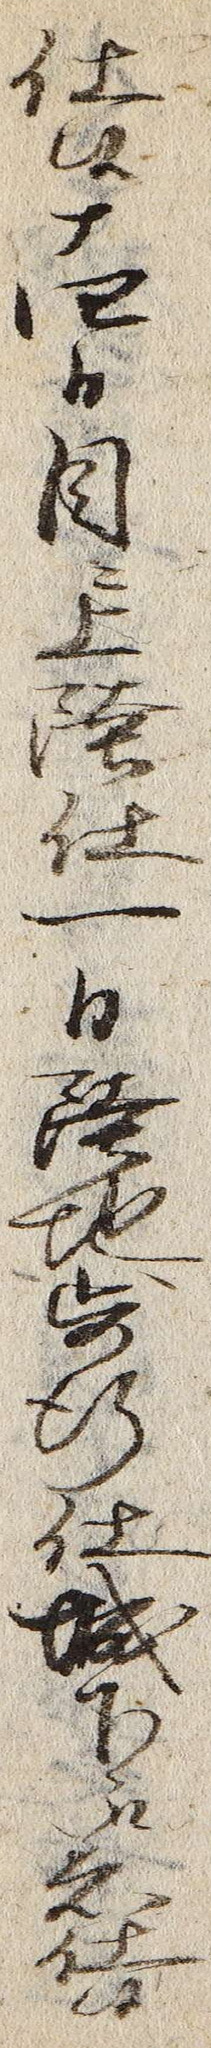仕候十四日目に上陸仕一日陸地歩行仕城下へ着仕候
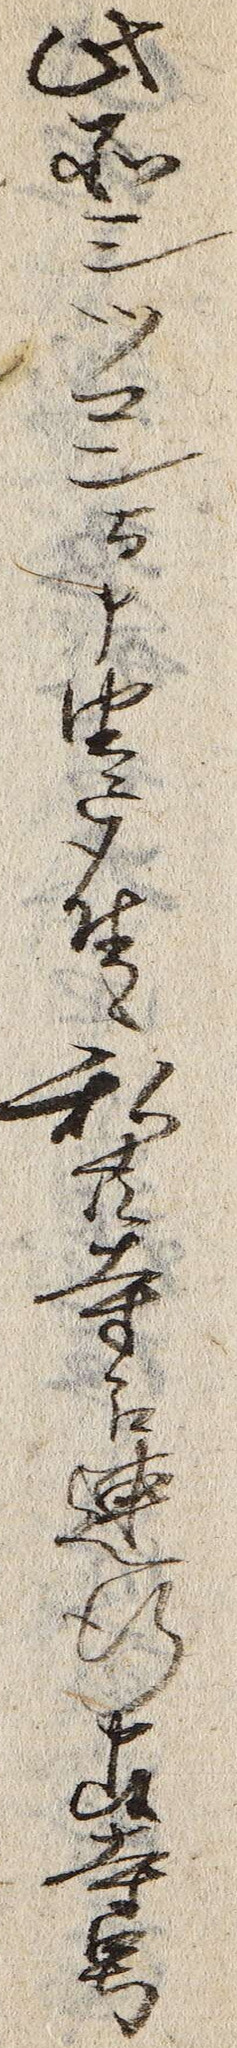此所シツコンと申由に御座候私ども寺へ連行申候寺号
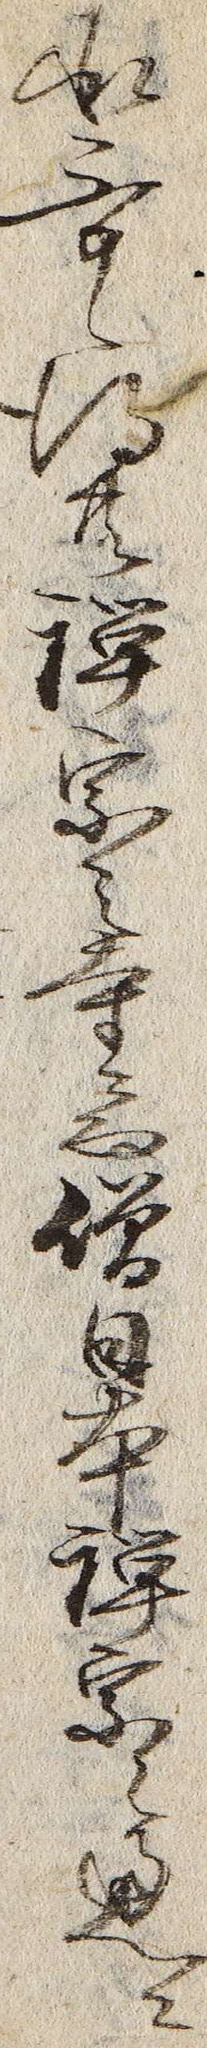承不申候得ども禅宗の寺にて僧日本禅宗の通に
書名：能登国清兵衛異国江漂流之始末
